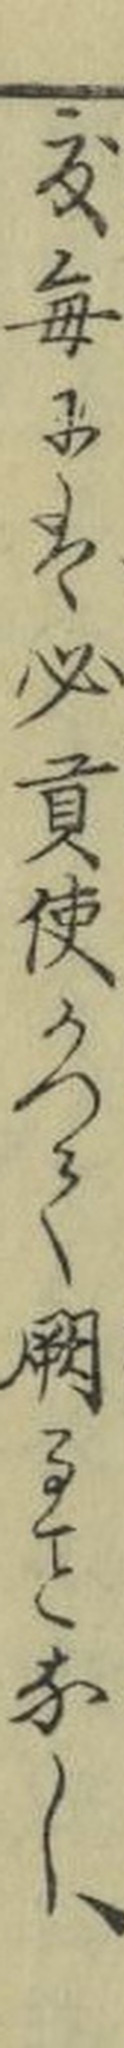度毎には、必貢使かつて闕ることなし、
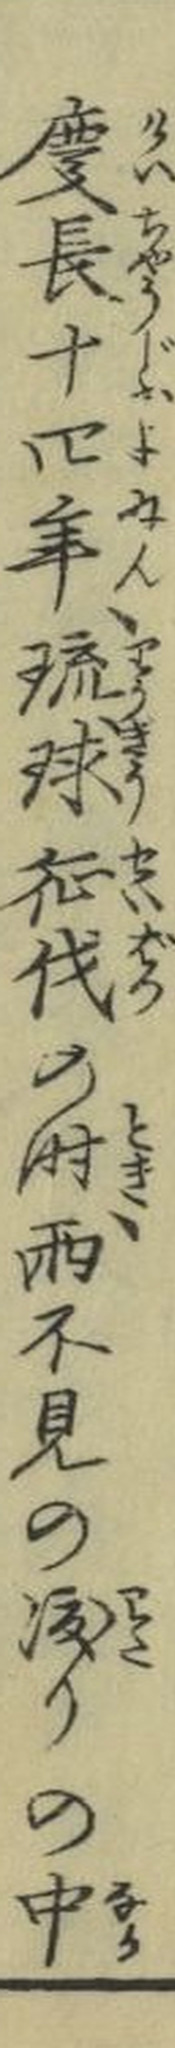慶長十四年、琉球征伐の時、雨不見の渡りの中
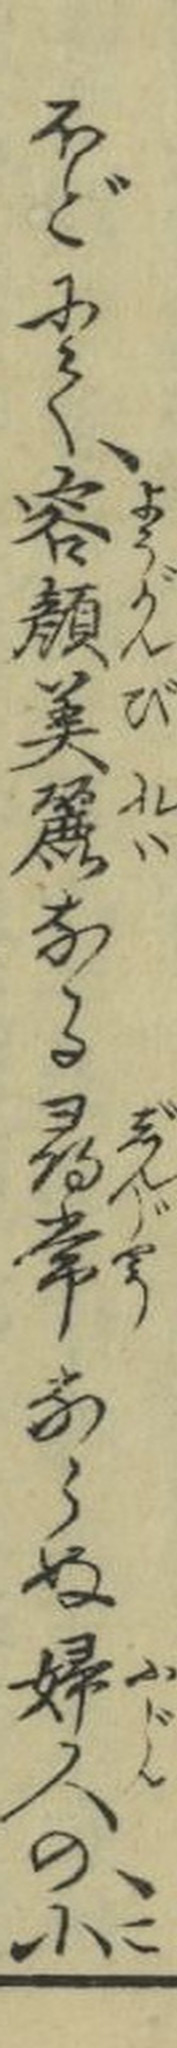ほどにて、容顔美麗なる尋常ならぬ婦人の、小
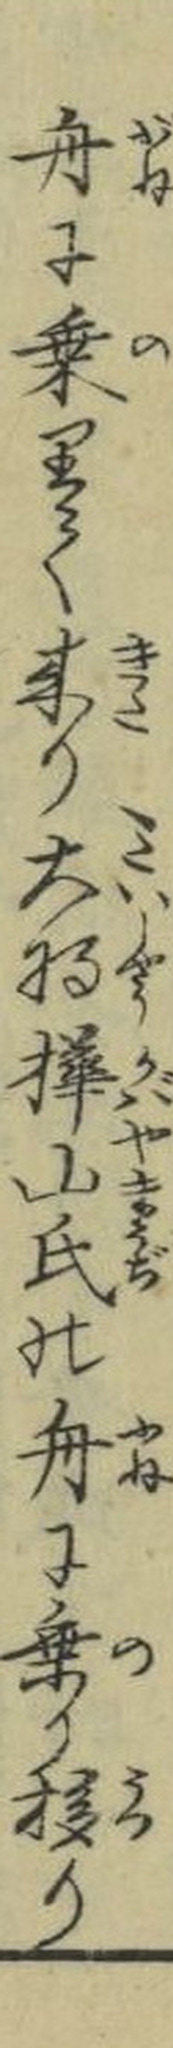舟に乗りて来り、大将樺山氏の舟に乗り移り
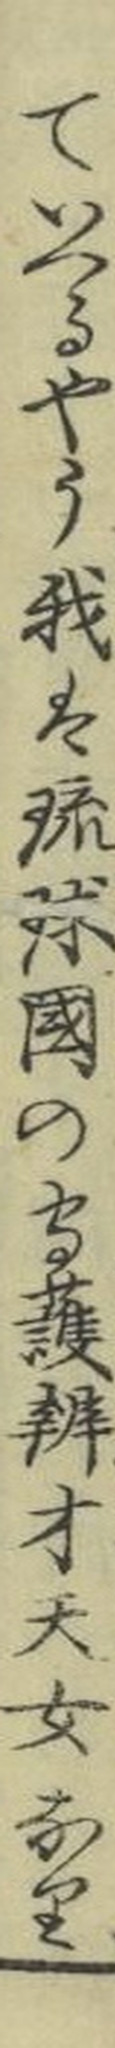ていへるやう、我は琉球国の守護弁才天女なり、
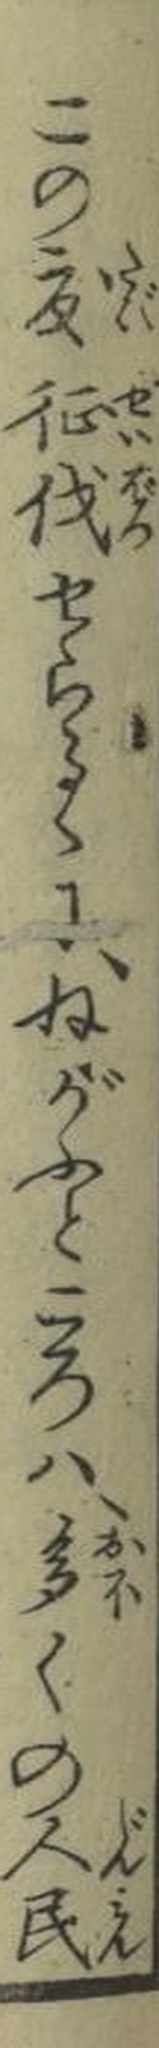この度征伐せらるゝに、ねがふところは、多くの人民
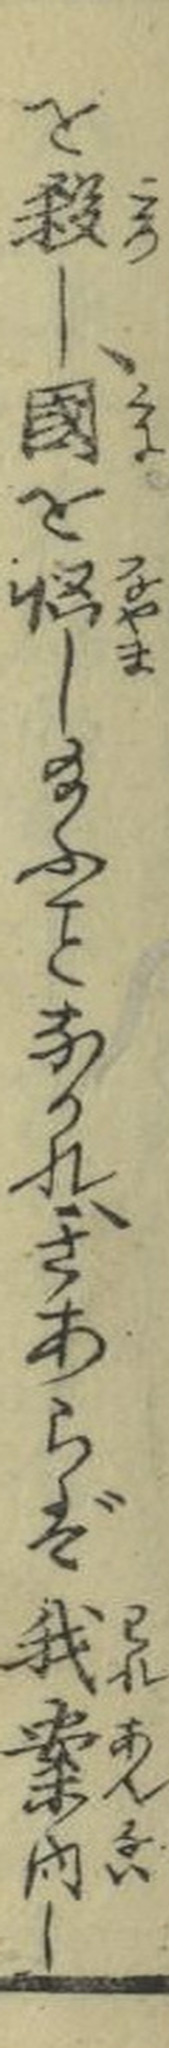を殺し、国を悩し給ふことなかれ、さあらば我案内し
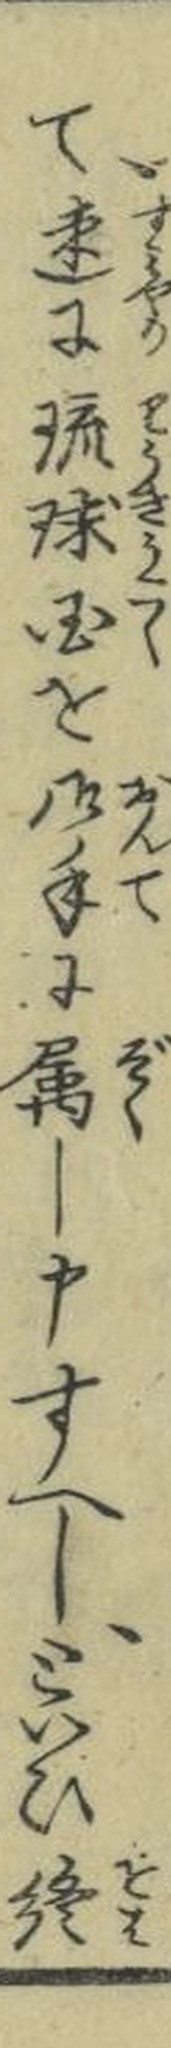て、速に琉球国を御手に属し申すへし、といひ終
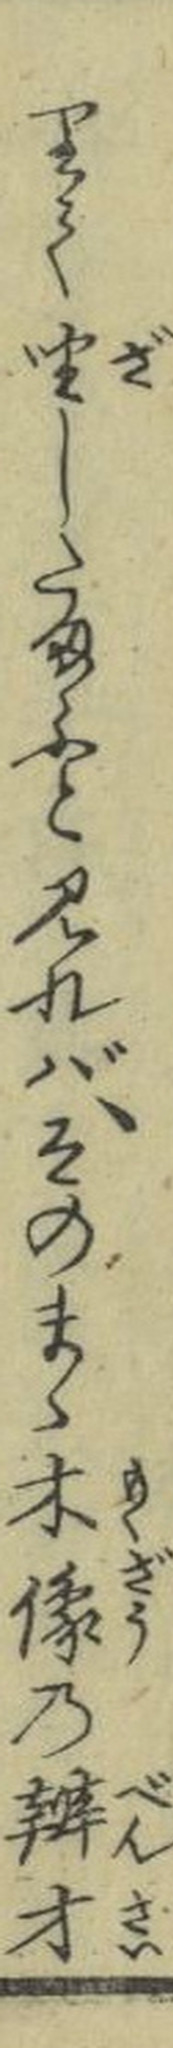りて坐したまふと見れば、そのまゝ木像の弁才
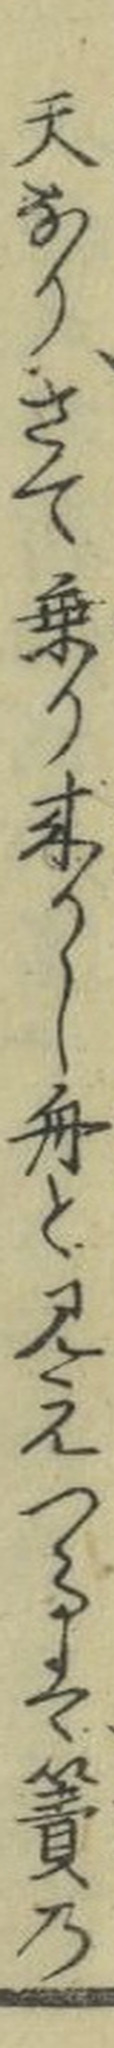天なり、さて乗り来りし舟と見えつるは、簀の
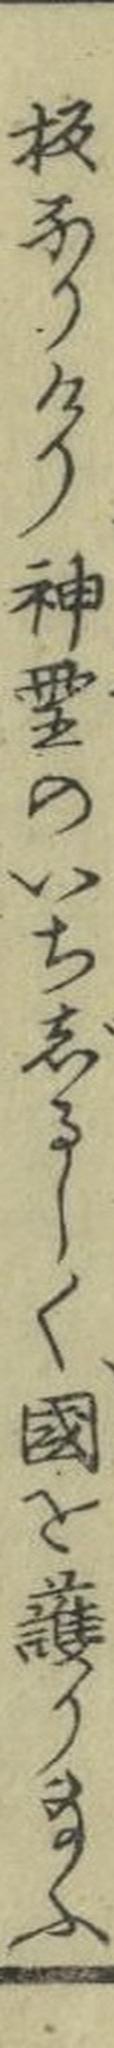板なりけり、神霊のいちじるしく、国を護り給ふ
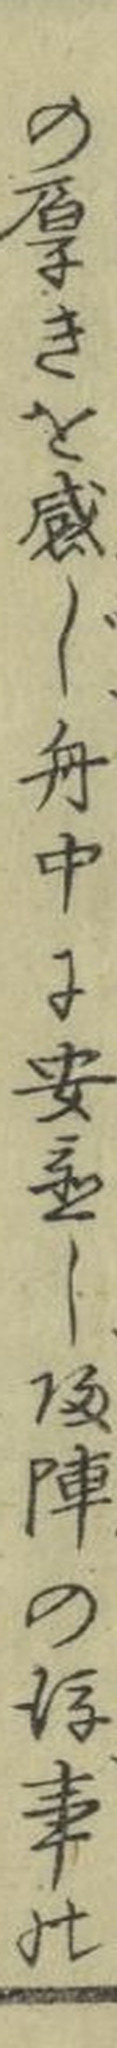の厚きを感じ、舟中に安置し、帰陣の後、事の
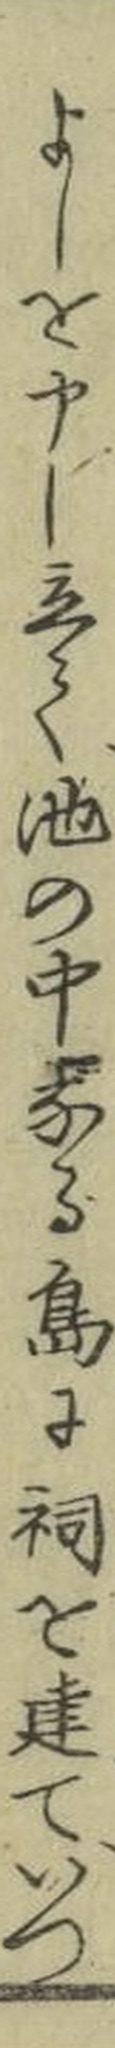よしを申し立て、池の中なる島に祠を建て、いつ

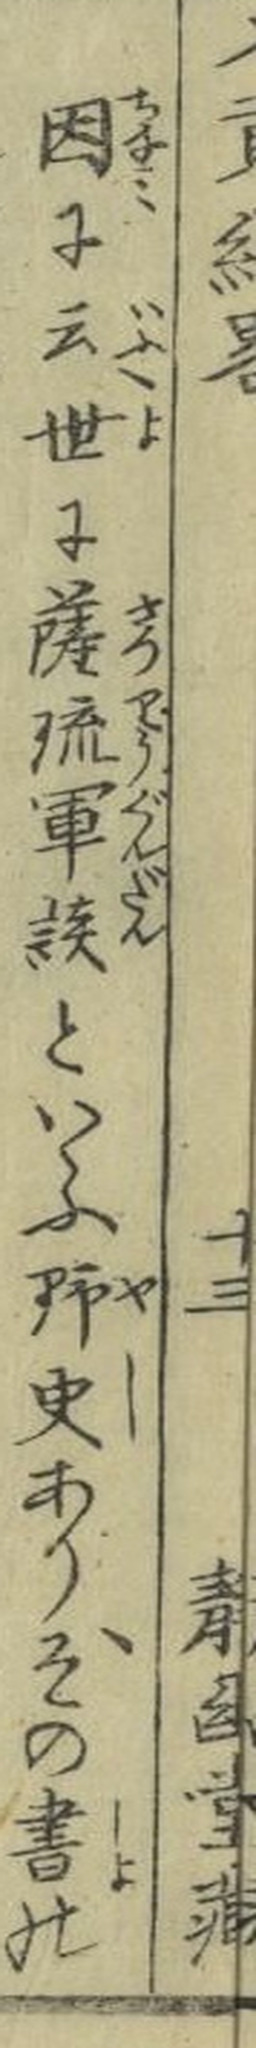因に云、世に薩琉軍談といふ野史あり、その書の
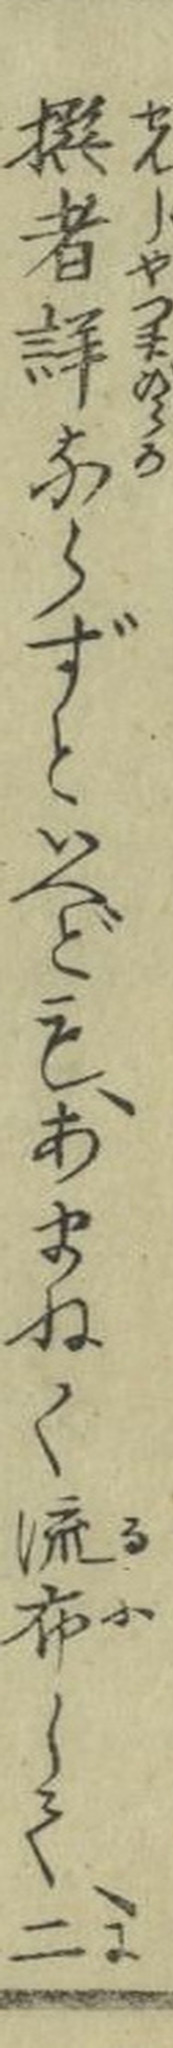撰者詳ならずといへども、あまねく流布して、二
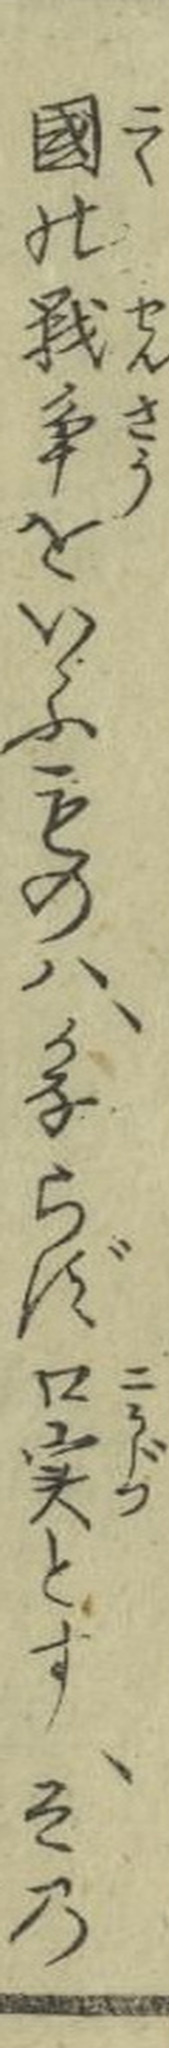国の戦争をいふものは、かならず口実とす、その
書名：琉球入貢紀略
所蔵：University of the Ryukyus Library
